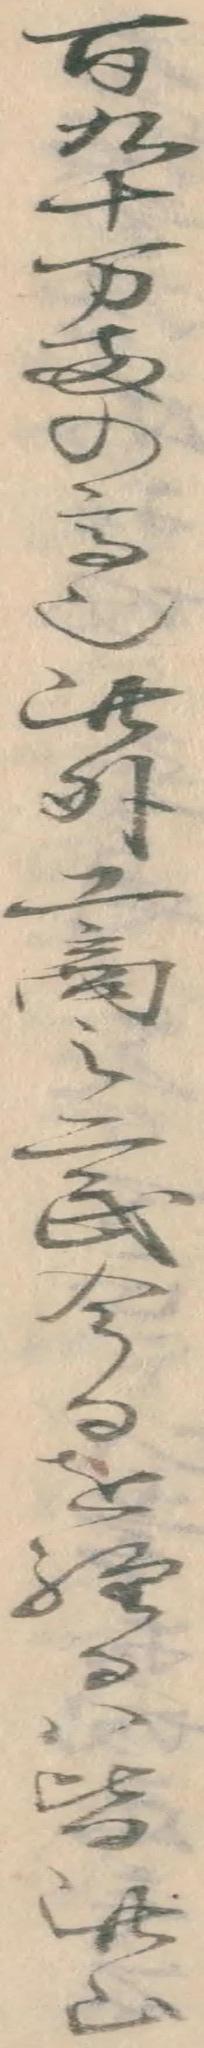百九十万両の高也此外工商の二民今日を経るは皆此山
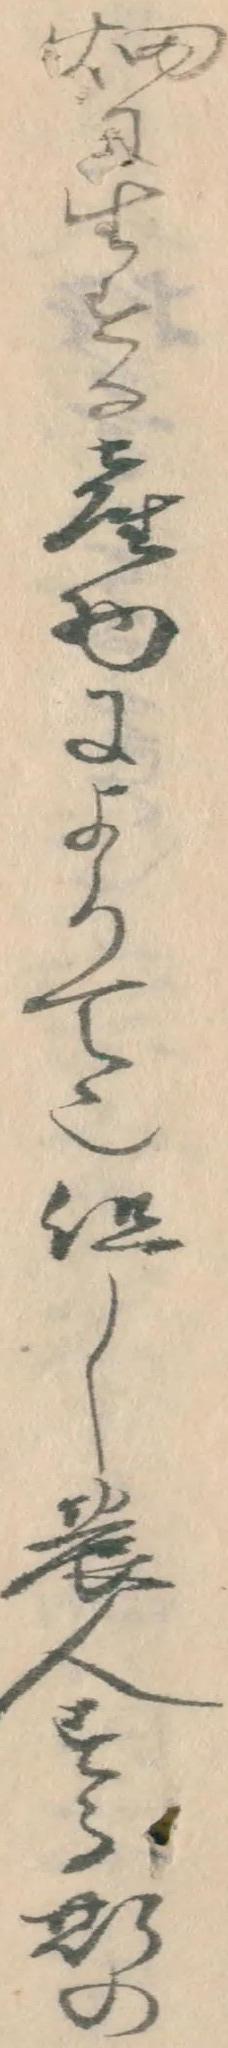畑に生する産物によりて也但し農人する斯の
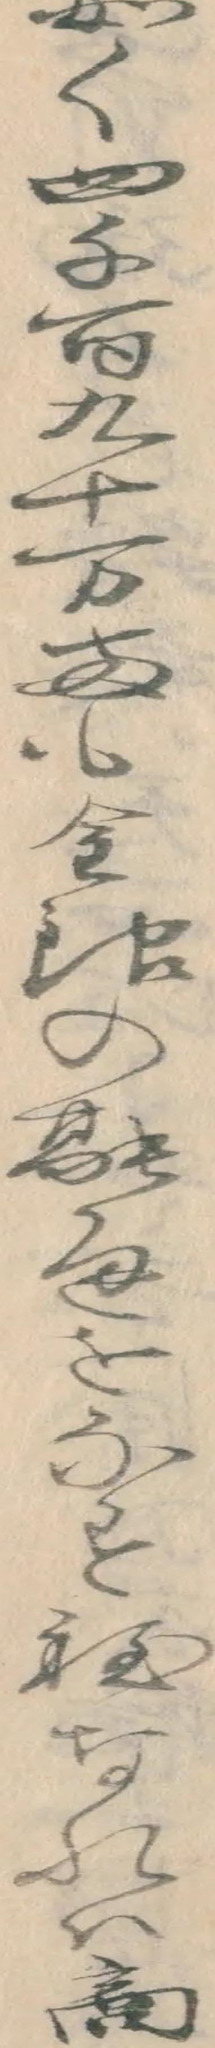如く四千百九十万両も金銀の融通をなす程なれは商
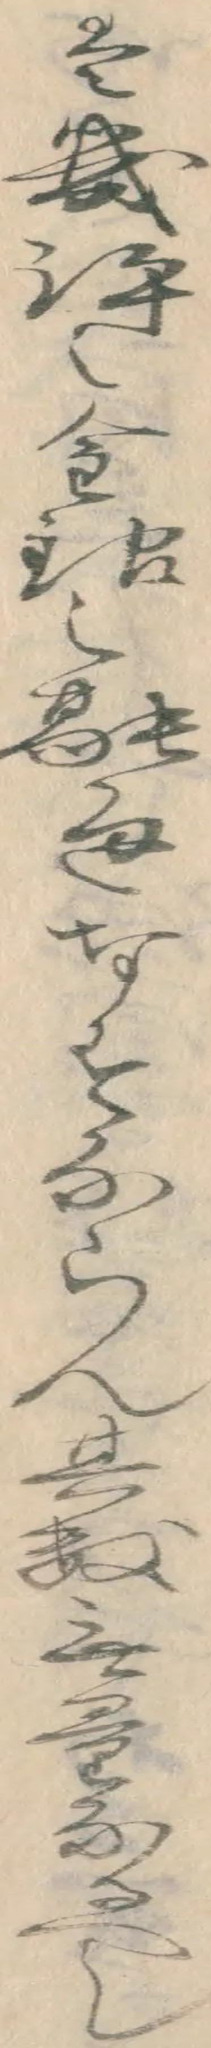は幾許之金銀之融通なすならん其数無量なるへし
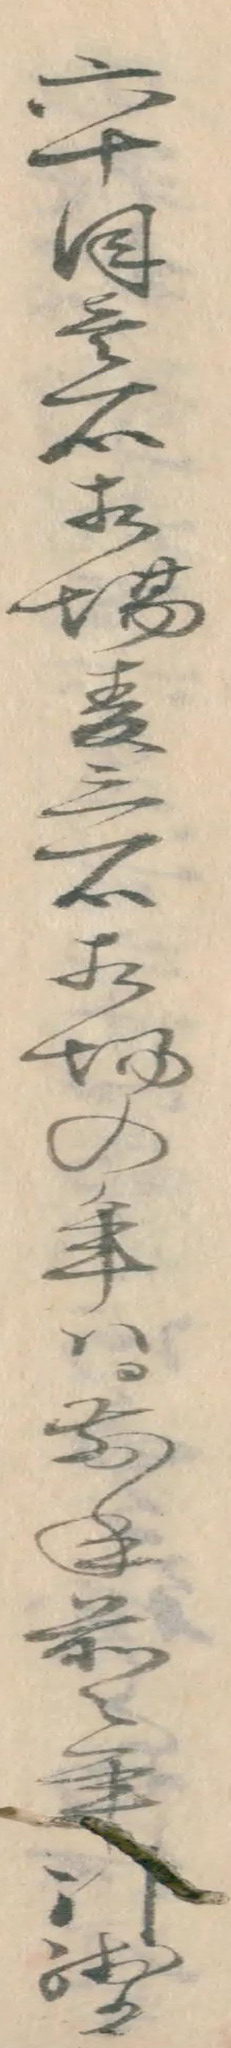一六十目壱石相場麦三石相場の年は°前年前之年引残り

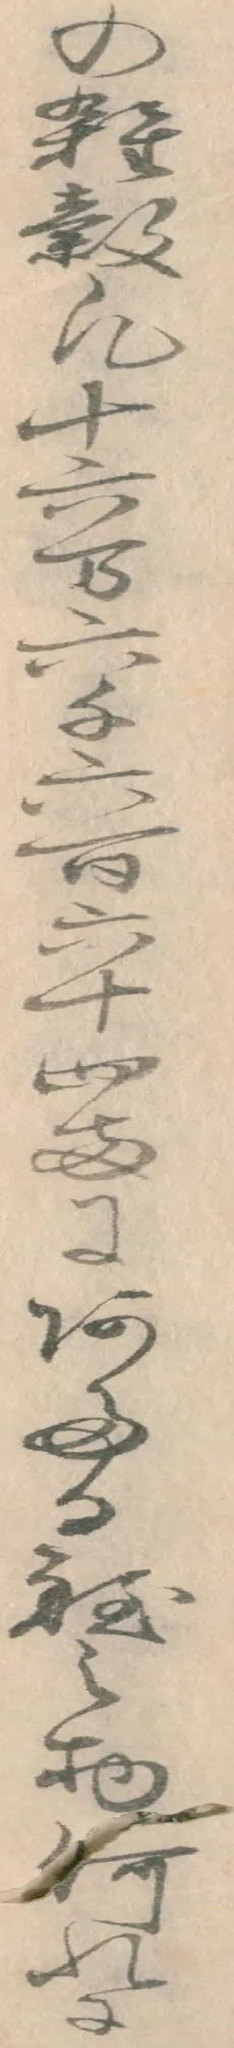の雑穀凡十六万六千六百六十四両にあたる程之物何れに
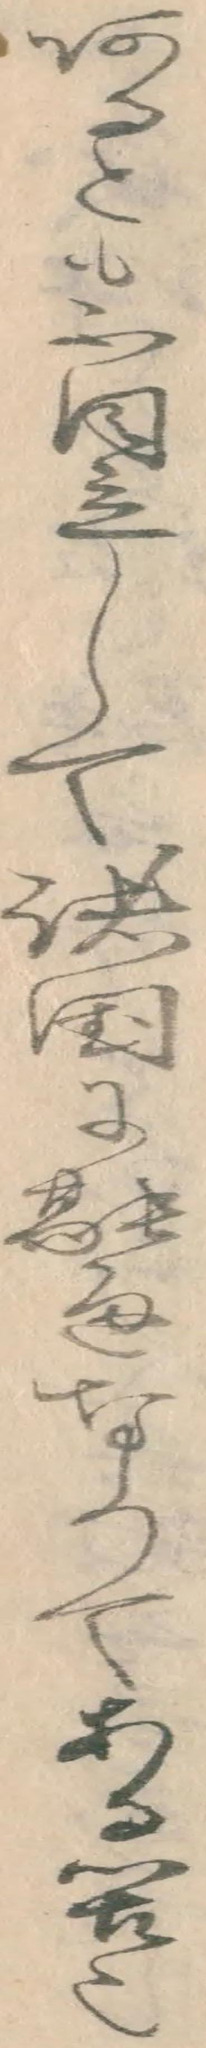あるとも不目立して諸国に融通なりてある筈也
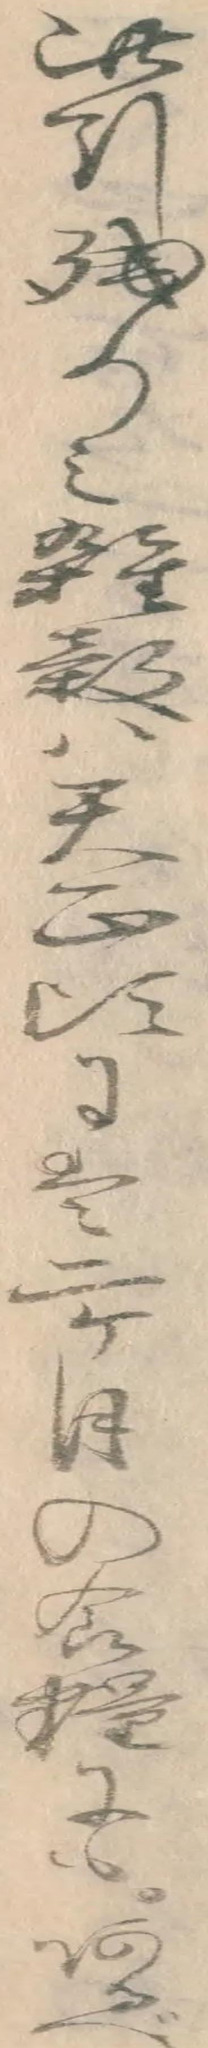此引残り之雑穀は天正頃には二ヶ月の食糧にも°あるべ
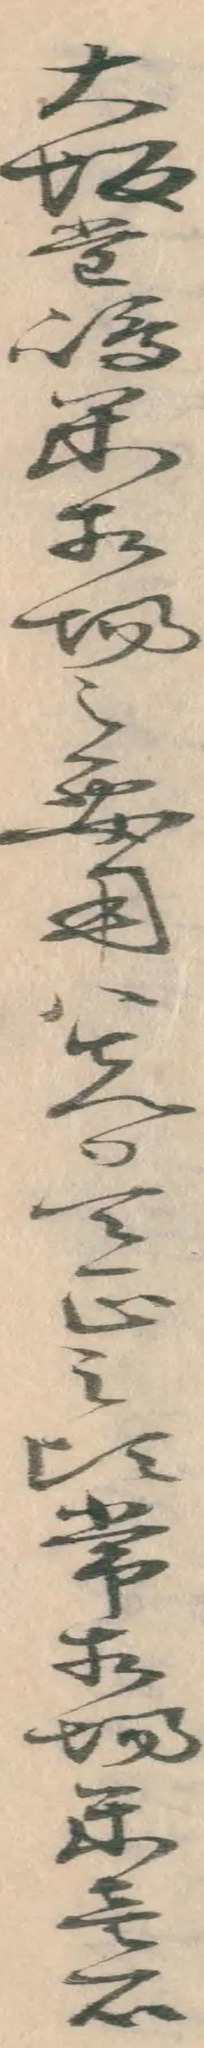一大坂堂島米相場之要用は先○天正之頃常相場米壱石
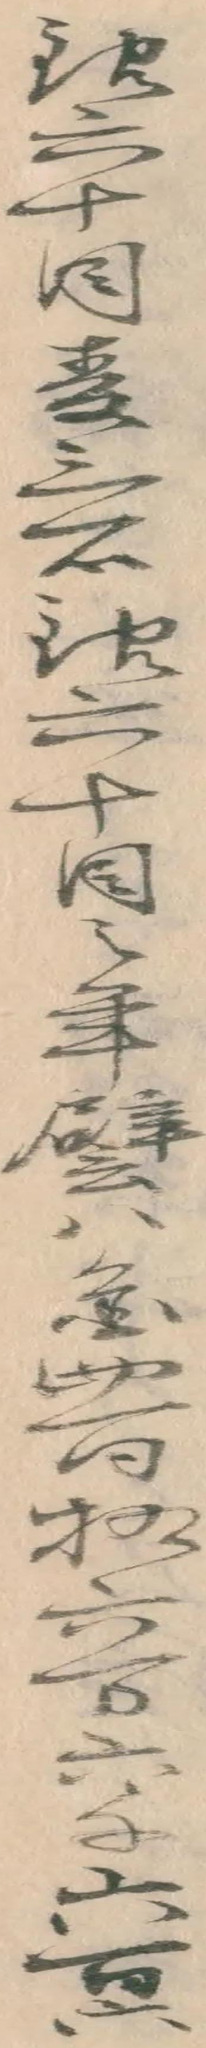銀六十目麦三石銀六十目之年譬は国四百拾六万六千六百六
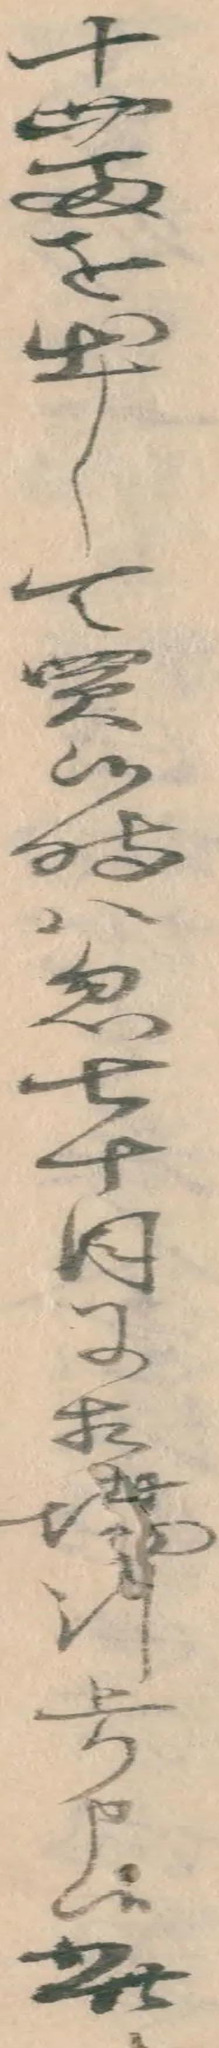十四両を出して買候時は忽七十目に相場引上り申候此
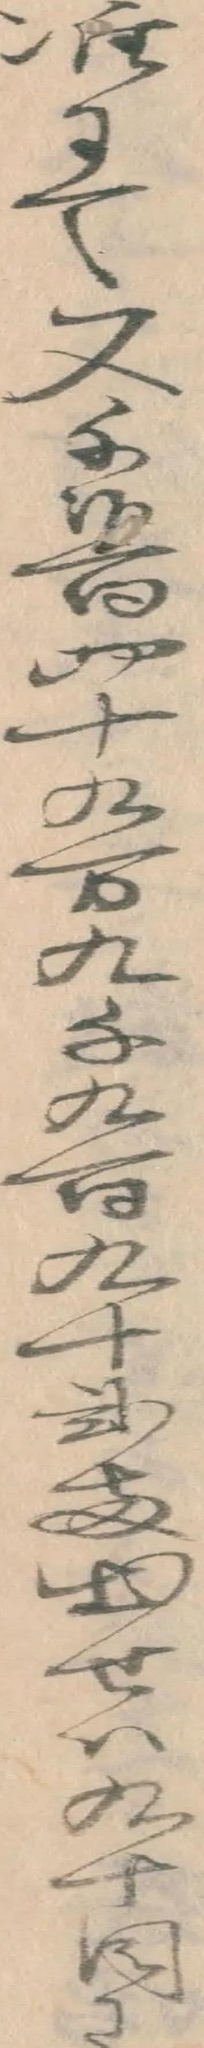准にて又千弐百四十九万九千九百九十弐両出せは九十目に
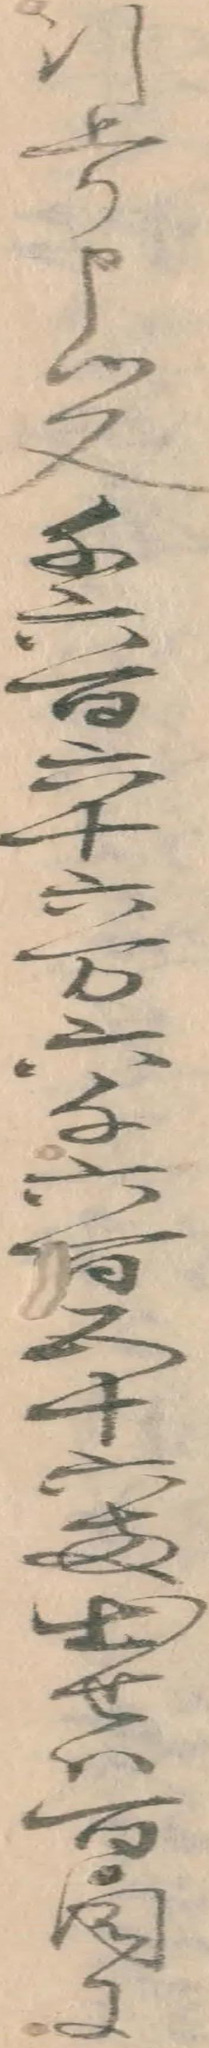引上り申候又千六百六十六万六千六百五十六両出せは百目に
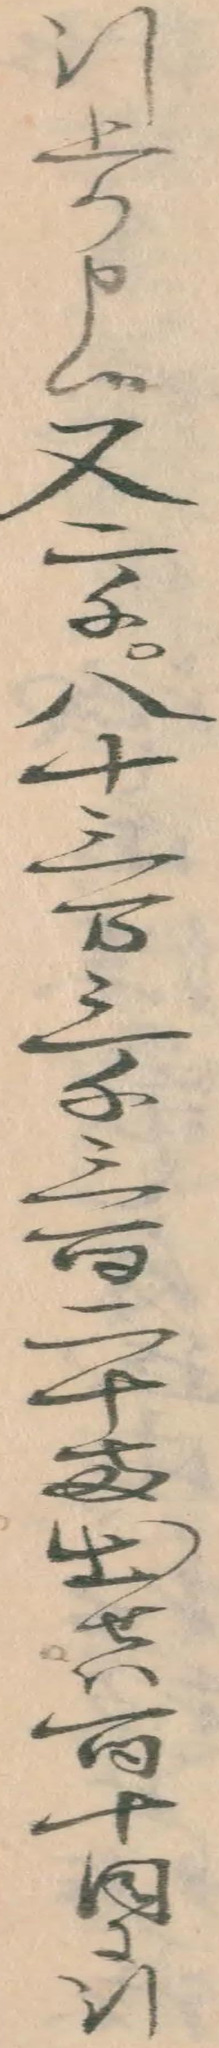引上り申候又二千°八十三万三千三百二十両出せは百十目に引
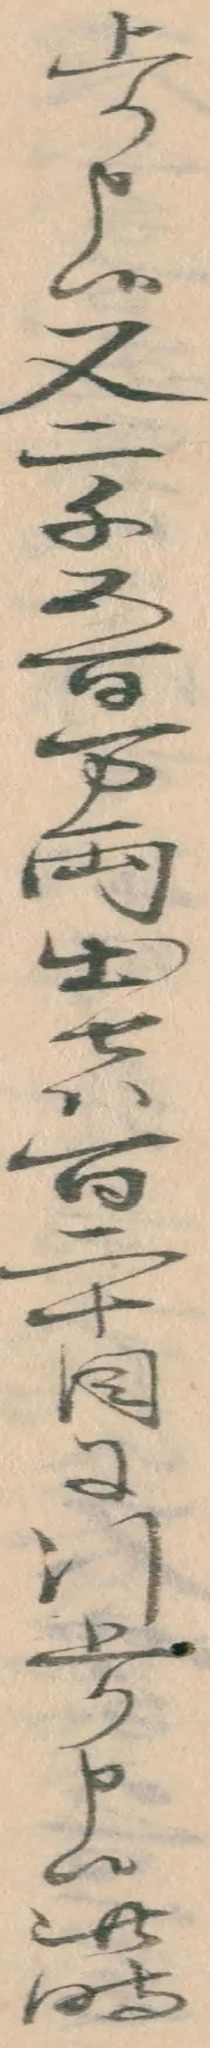上り申候又二千五百万両出せは百二十目に引上り申候此時
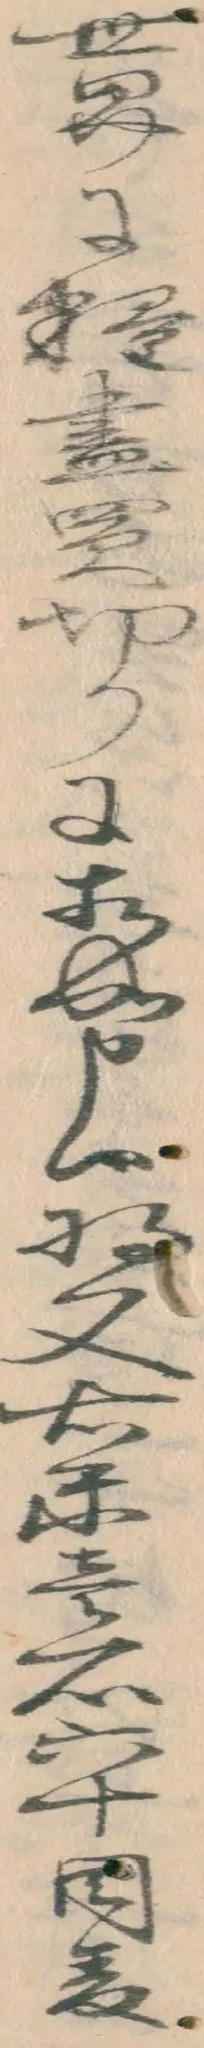世界に糧尽買切りに相成申候将又右米壱石六十目麦
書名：斎庭之穂
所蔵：国立国会図書館 National Diet Library, JAPAN
